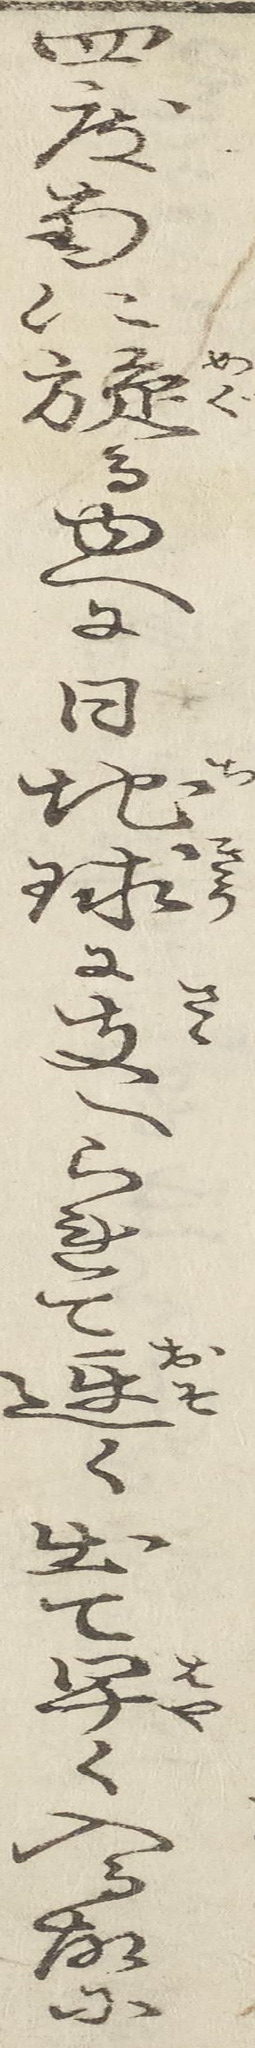四度南に旋るゆへに日地球に支へられて遅く出て早く入る故に
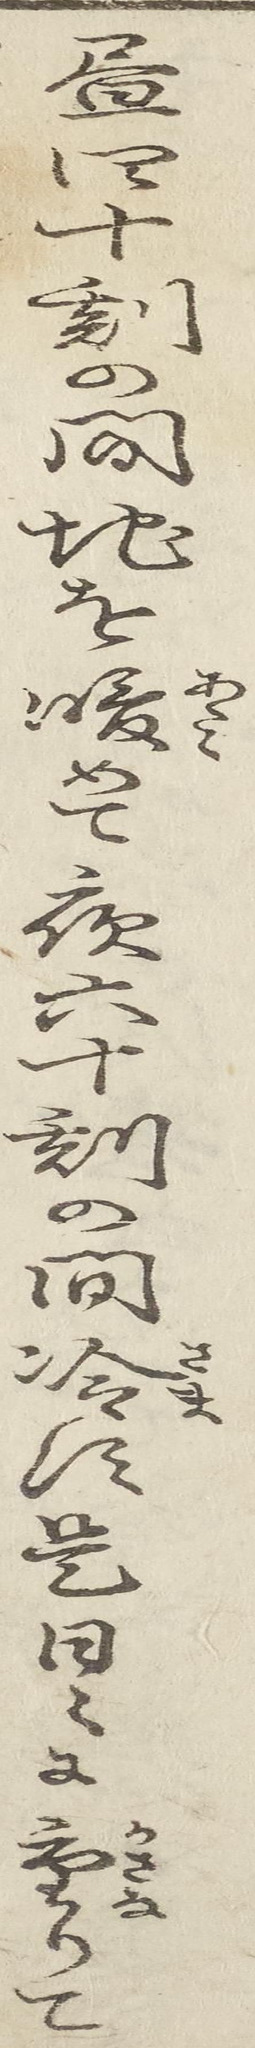昼四十刻の間地を暖めて夜六十刻の間冷す是日々に重りて
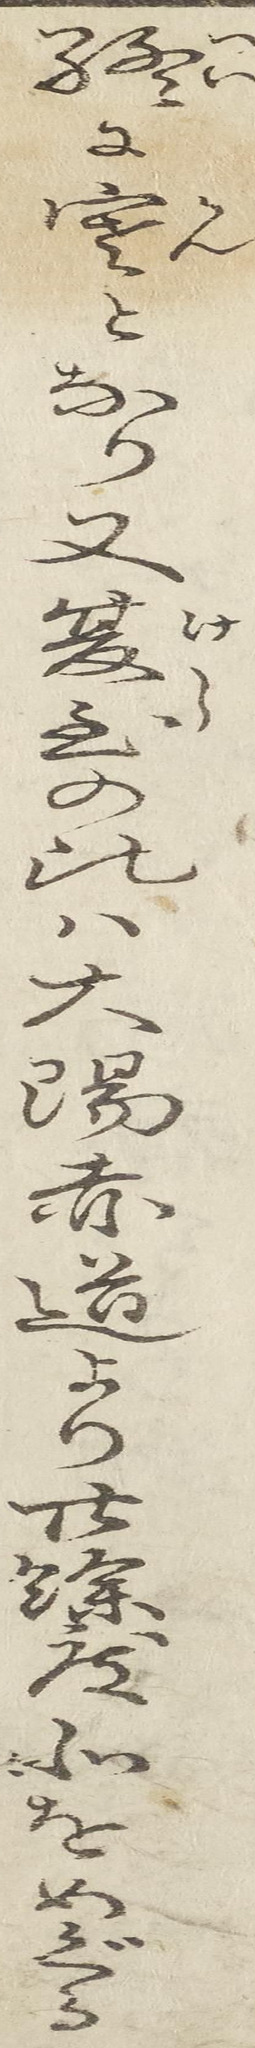終に寒となり又夏至の比は大陽赤道より廿余度北をめぐる
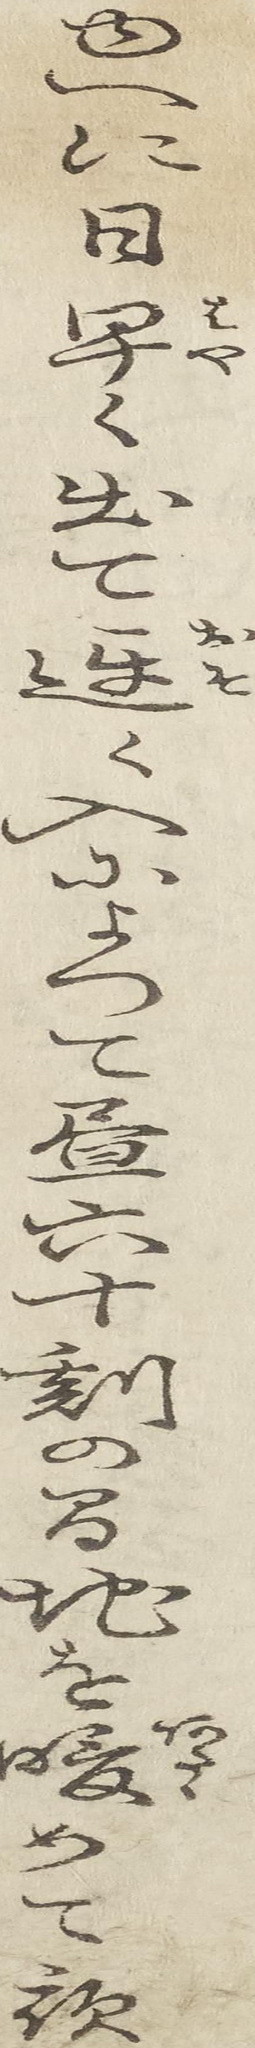ゆへに日早く出て遅く入によつて昼六十刻の間地を暖めて夜
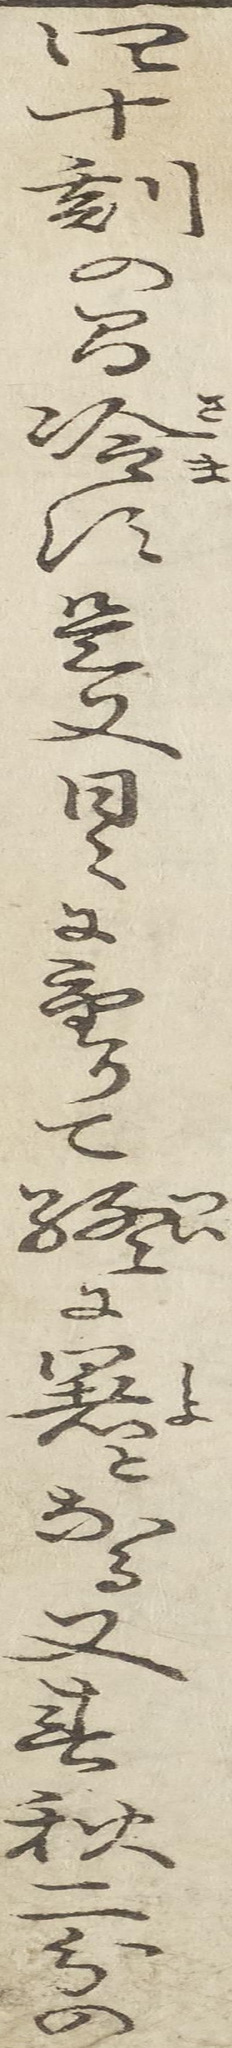四十刻の間冷す是又日々に重りて終に暑となる又春秋ニ分の

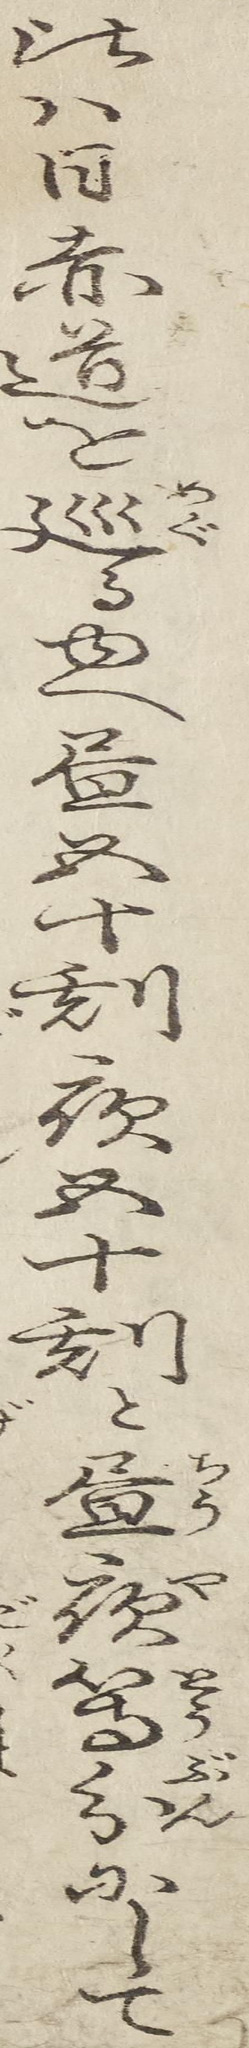此は日赤道を巡るゆへ昼五十刻夜五十刻と昼夜等分にして
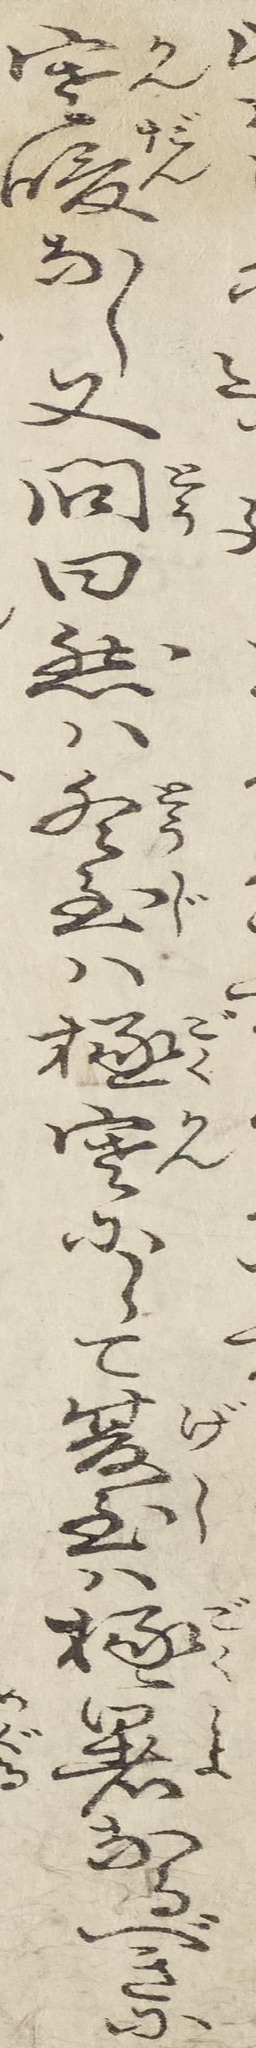寒暖なし又問曰然は冬至は極寒にして夏至は極暑なるべきに
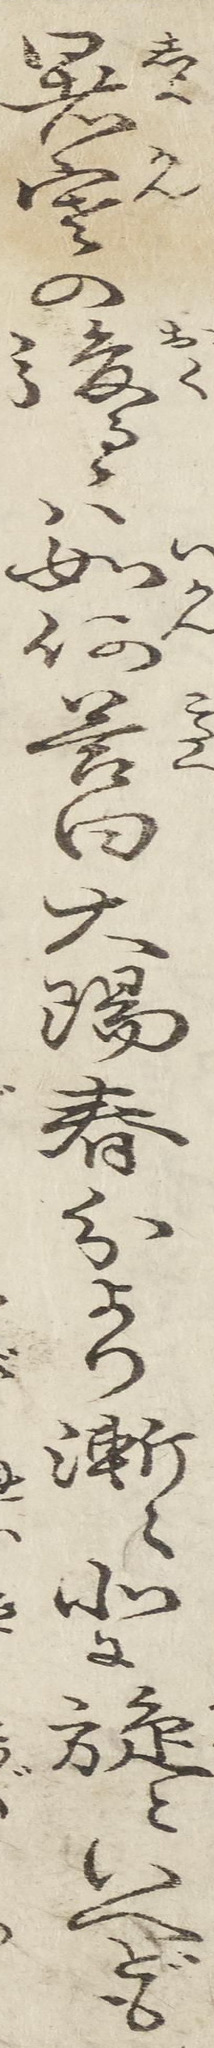暑寒の後るゝは如何答曰大陽春分より漸々北に旋といへども
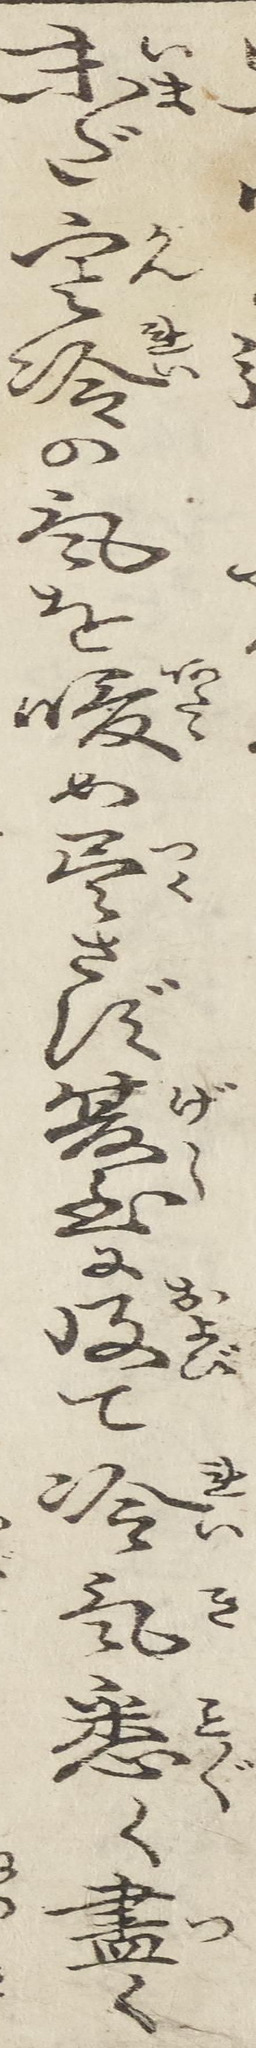未だ寒冷の気を暖め尽さず夏至に及て冷気悉く尽く
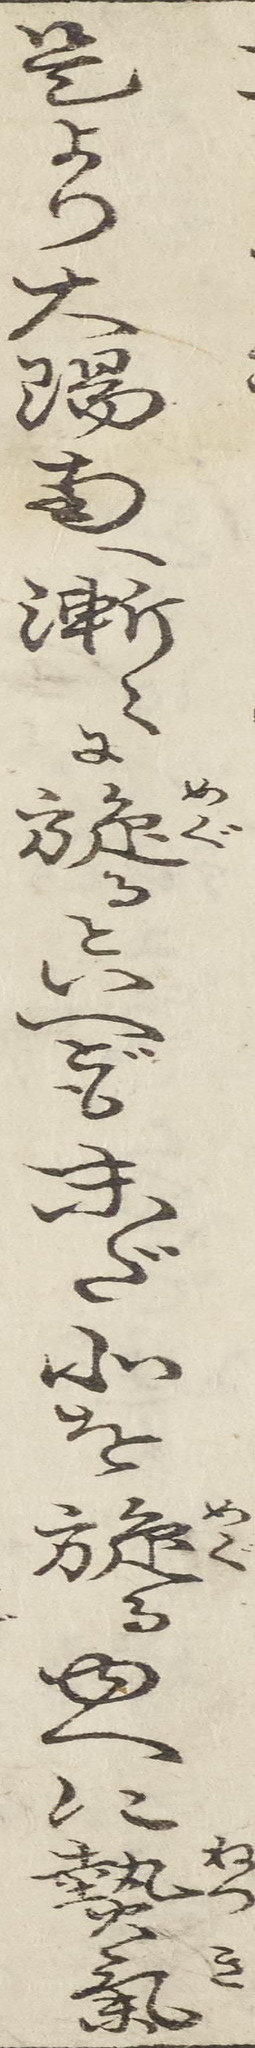是より大陽南へ漸々に旋るといへども未だ北を旋るゆへに熱気
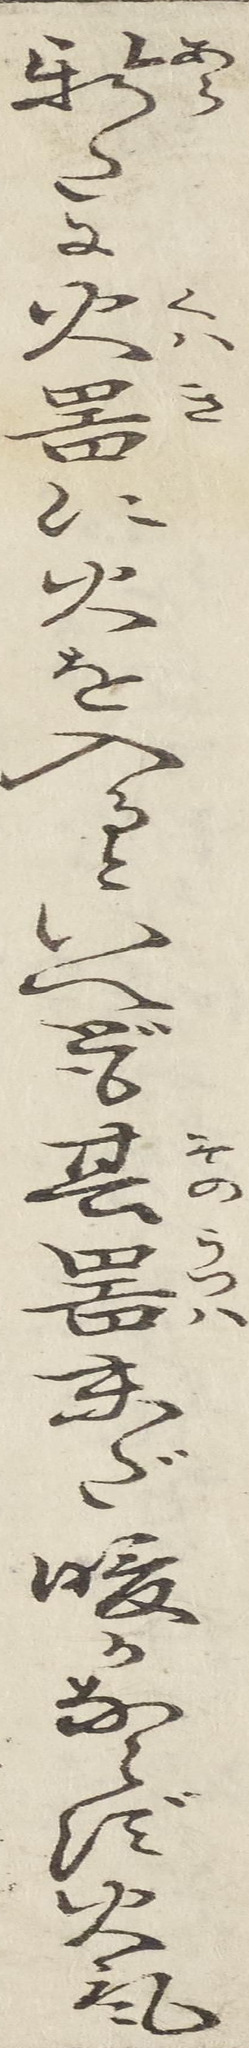新たに火器に火を入るといへども其器未だ暖かならず火気
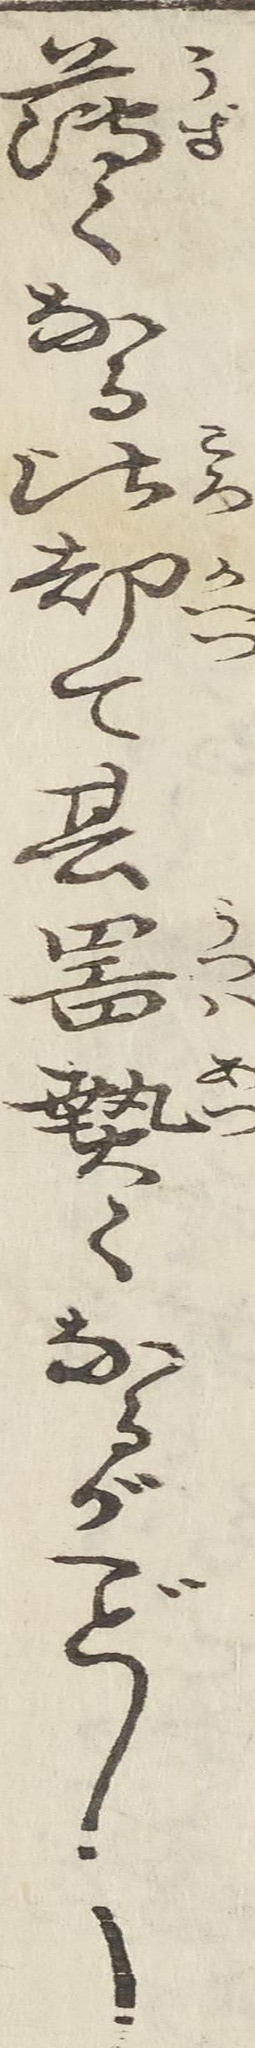薄くなる比却て其器熱くなるがごとし
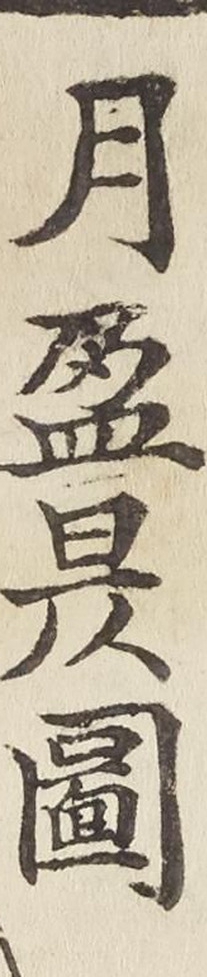月盈昃図
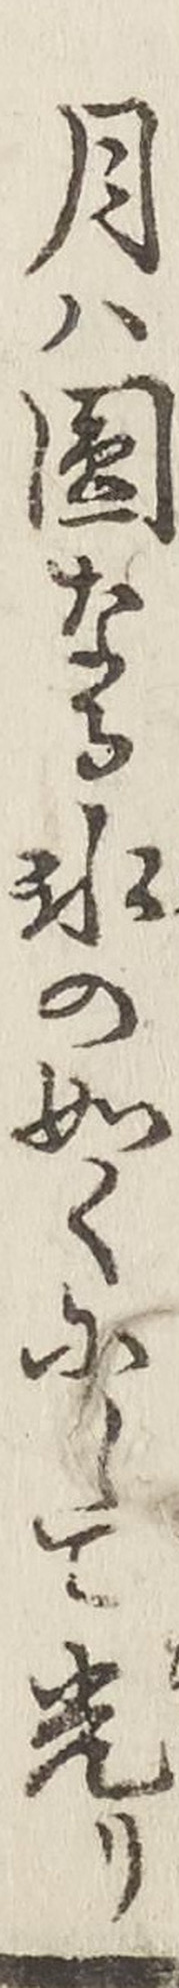月は円なる氷の如くにして光リ
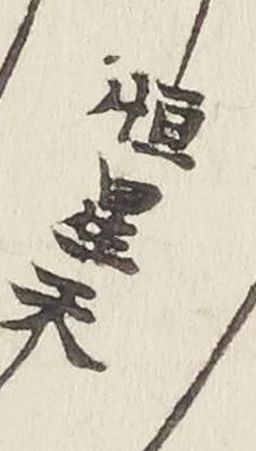恒星天
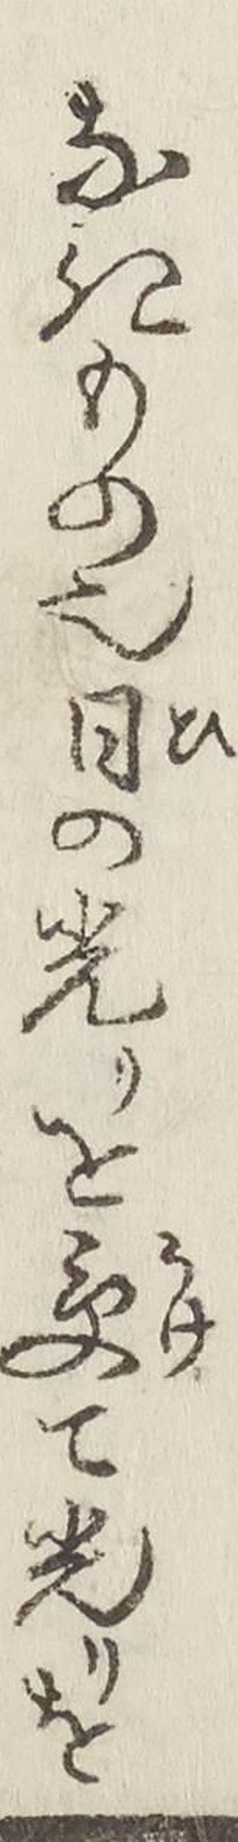なきもの也日の光リを受て光リを
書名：平天儀圖解
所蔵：東京大学地震研究所図書室 Earthquake Research Institute Library, The University of Tokyo, JAPAN
